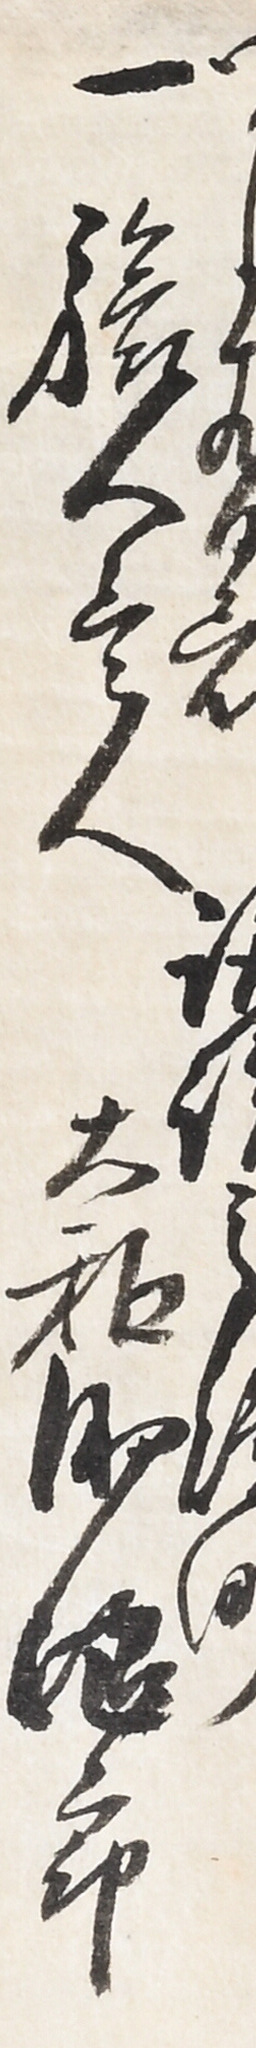一旅人壱人大和助四郎
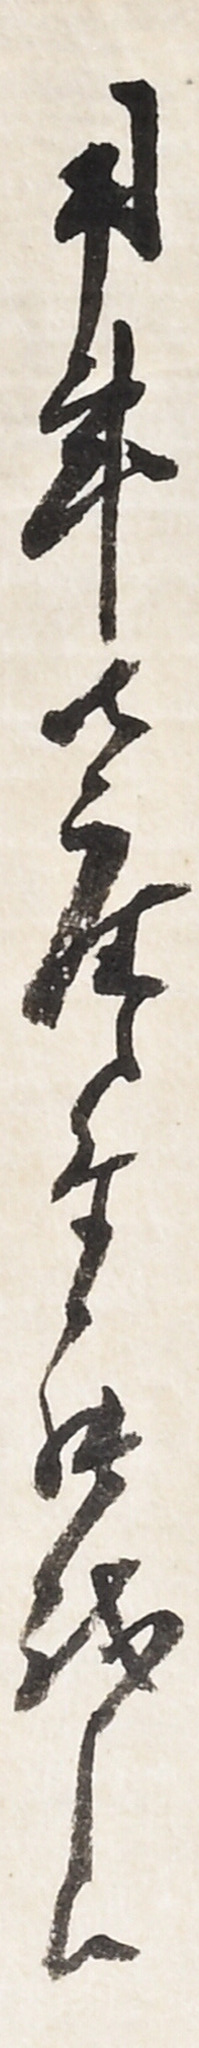用事御座候付罷越申候
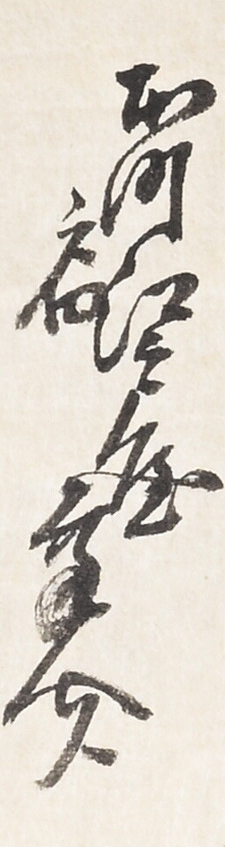本町江戸屋
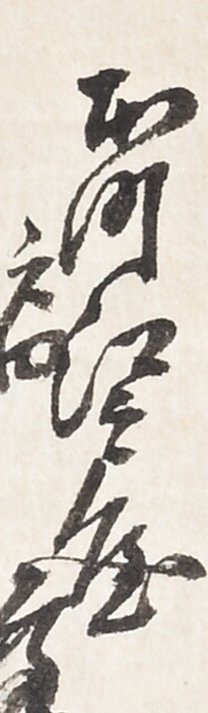本町江戸屋
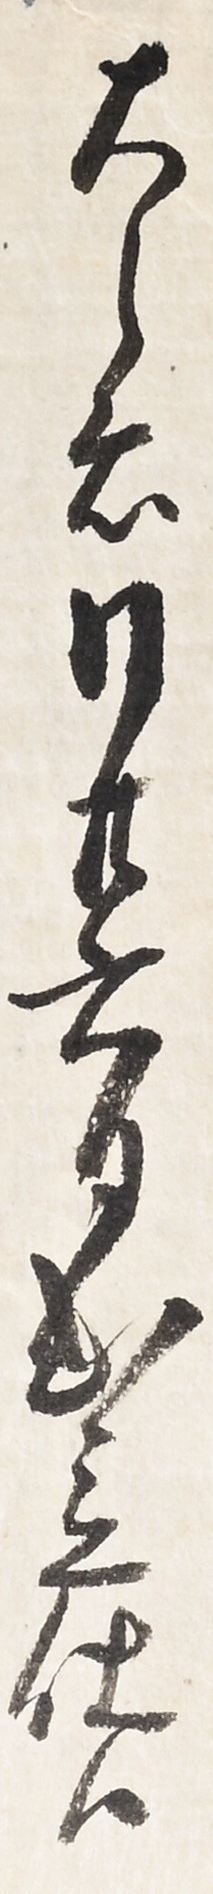右之者同廿六日出立仕候
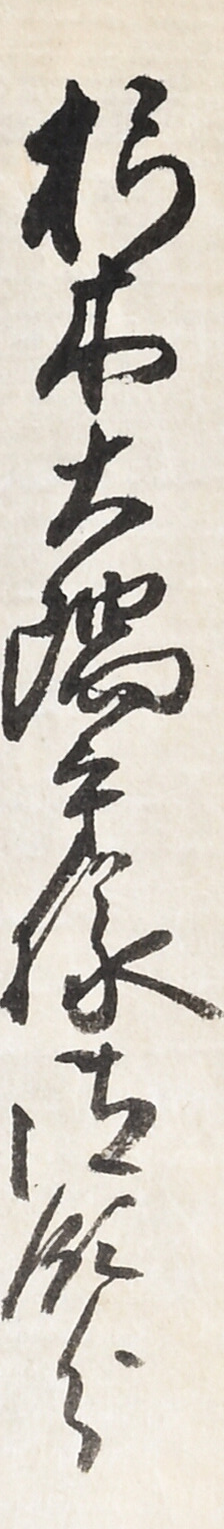朽木大隅守様御領分
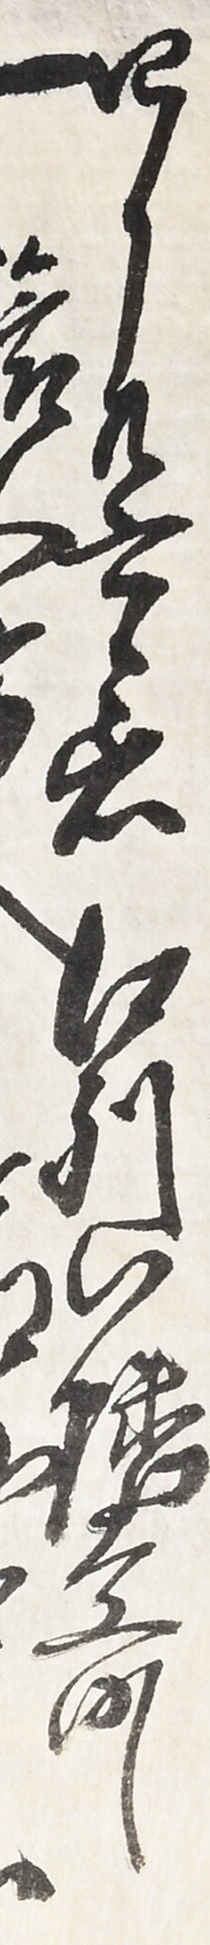四月廿六日着江州八幡大工町
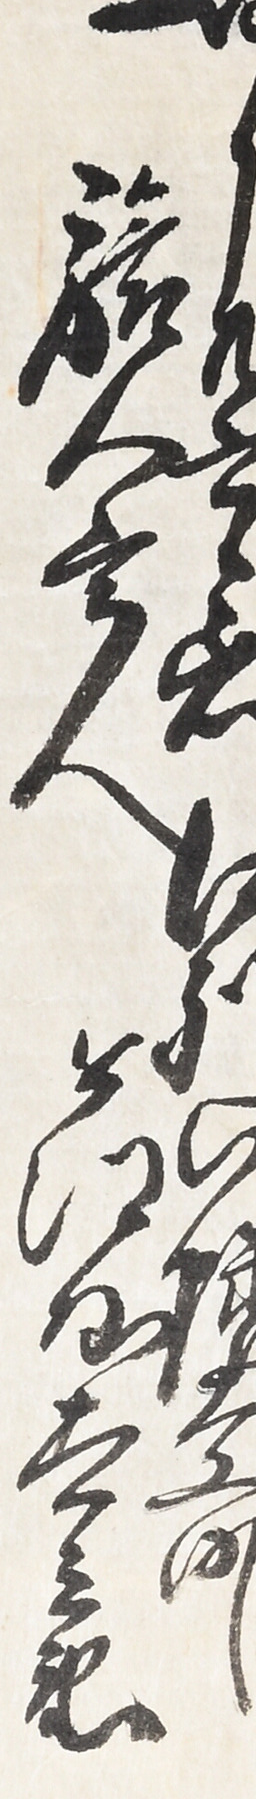一旅人壱人近江屋太兵衛
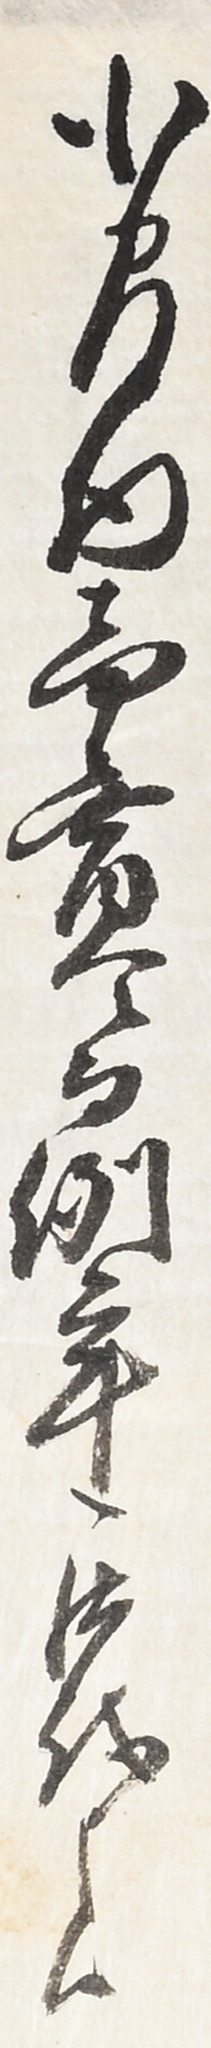小間物商売ニ而例年罷越申候
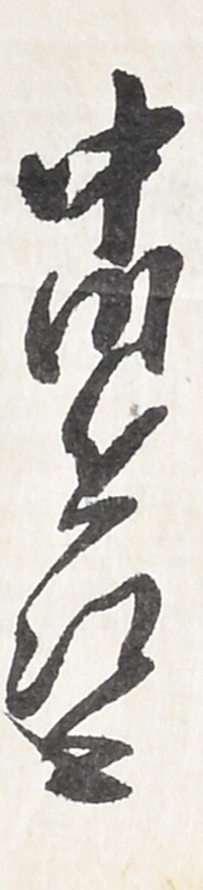中町近江屋
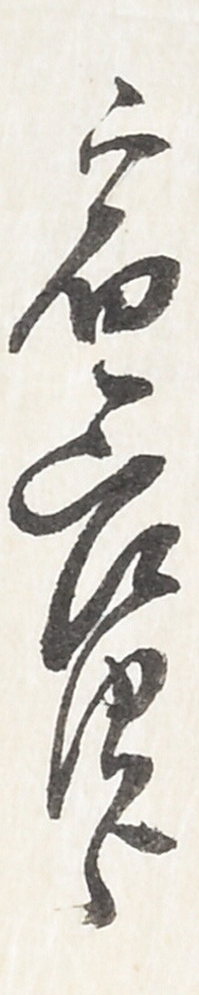宿善四郎
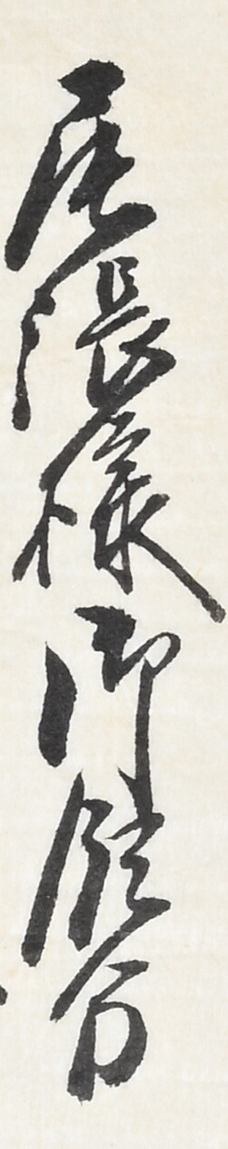尾張様御領分
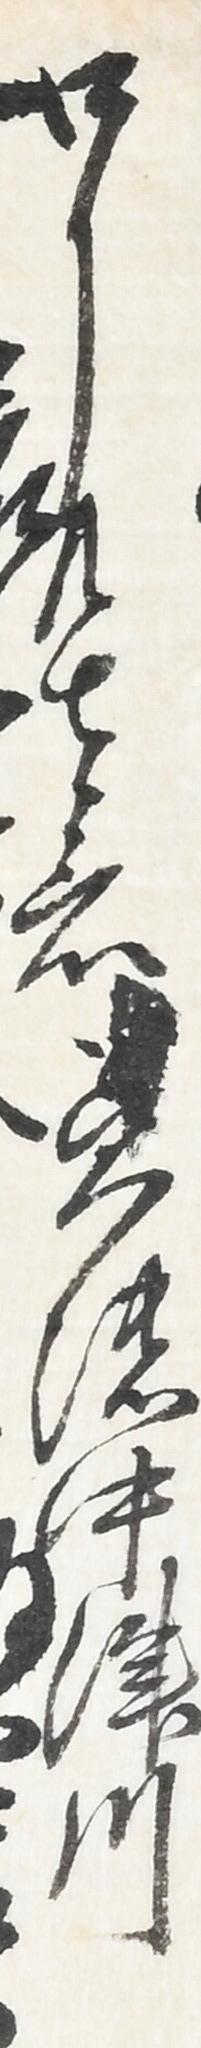四月廿七日着美濃中津川
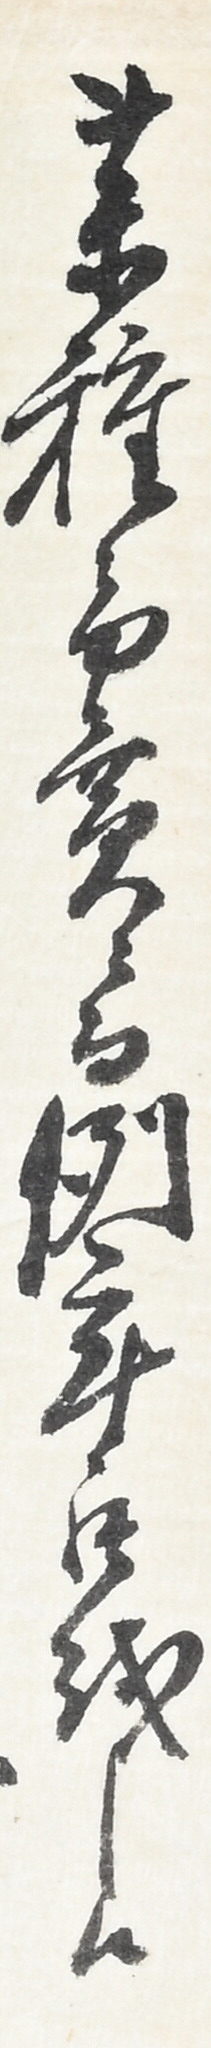薬種商売ニ而例年罷越申候
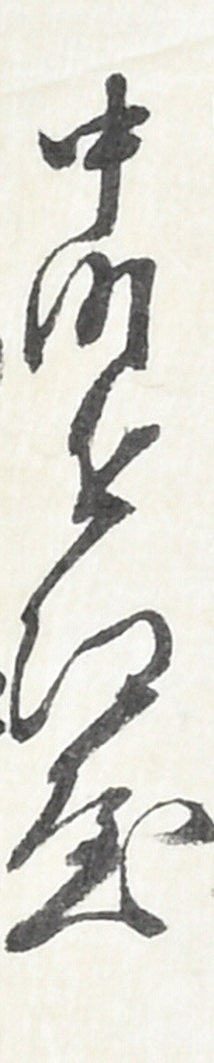中町近江屋
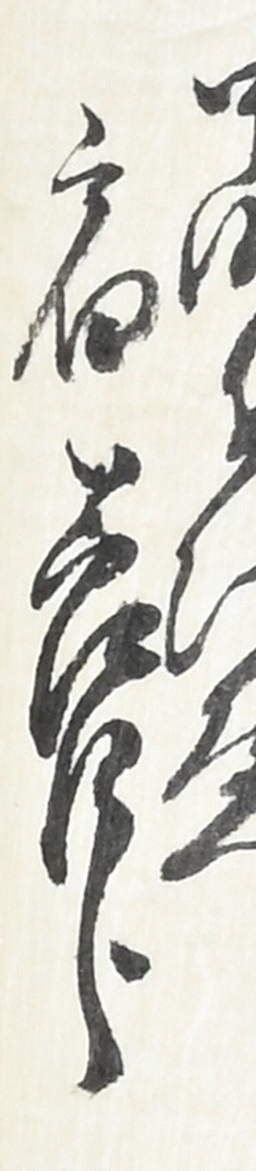宿久右衛門
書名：旅人泊控帳
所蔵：伊那市立高遠町図書館・合同会社AMANE
